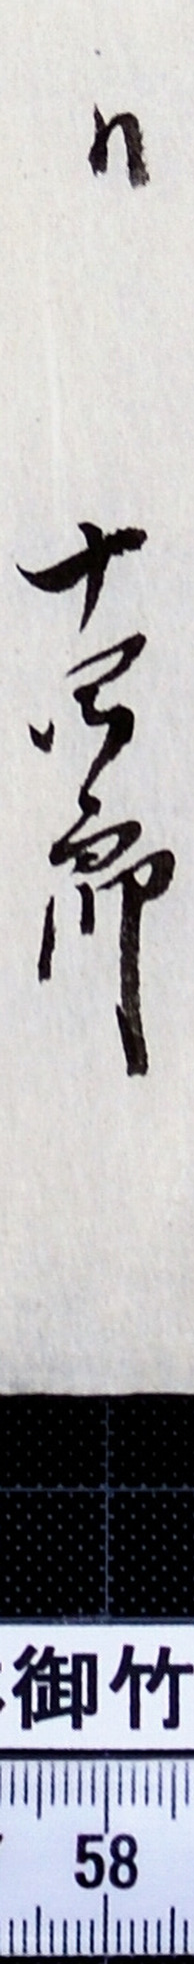同十四郎
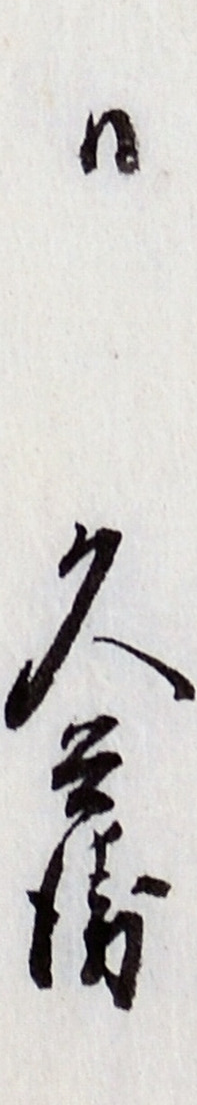同久兵衛
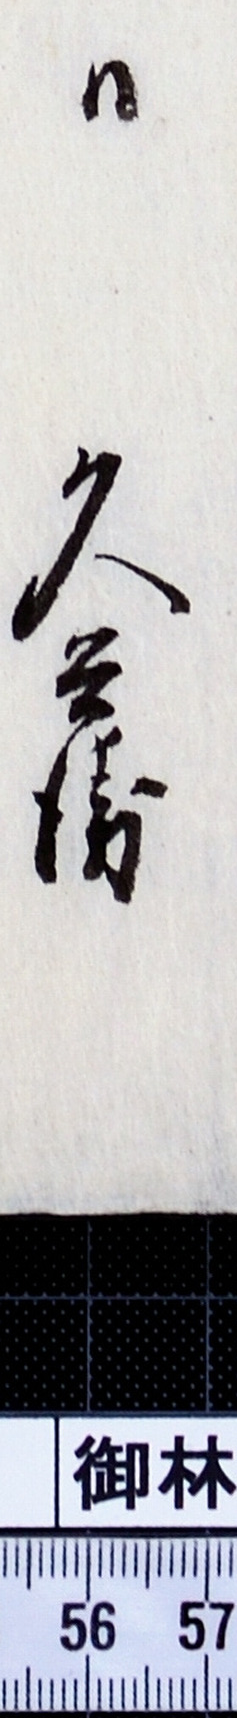同久兵衛
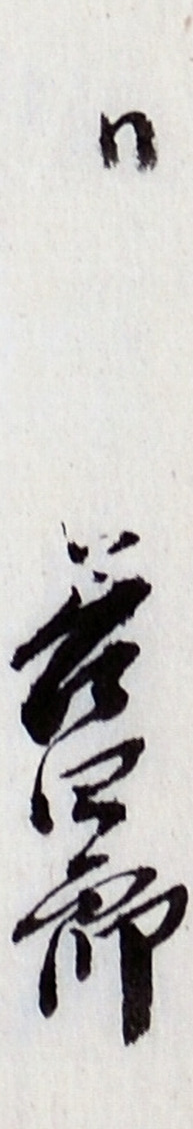同善四郎
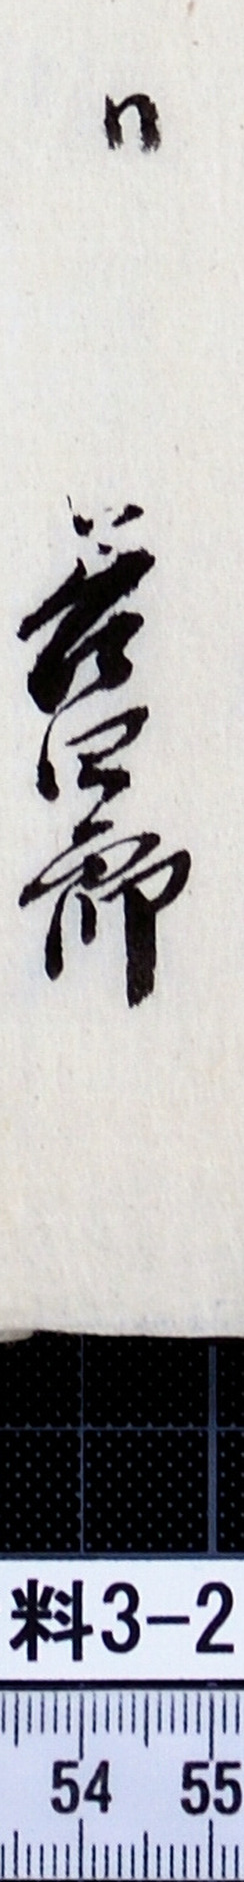同善四郎
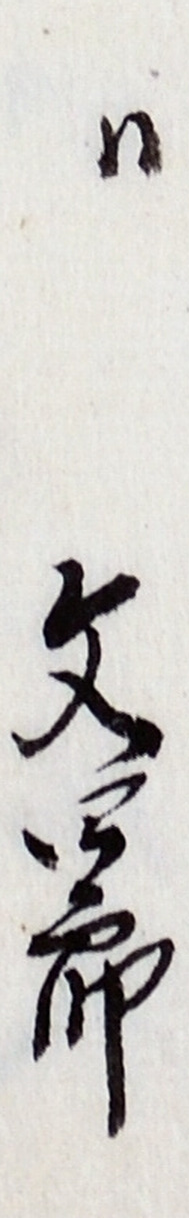同文四郎
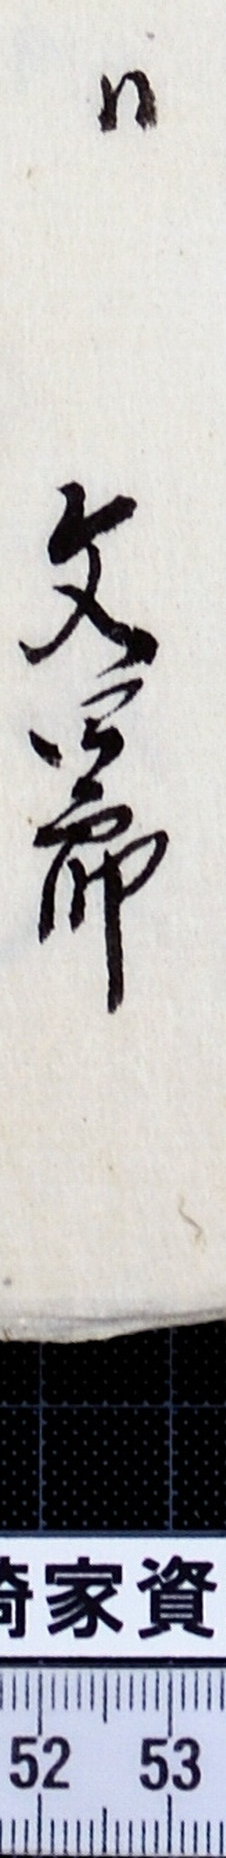同文四郎
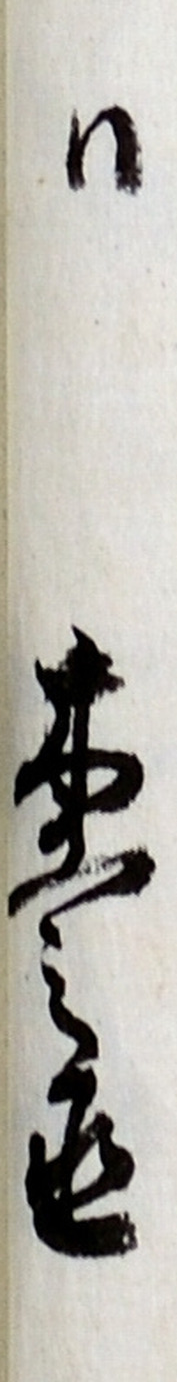同杢之丞
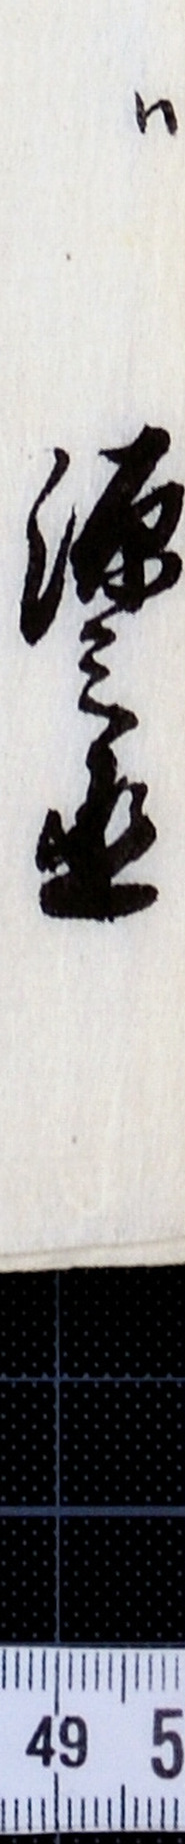同八兵衛
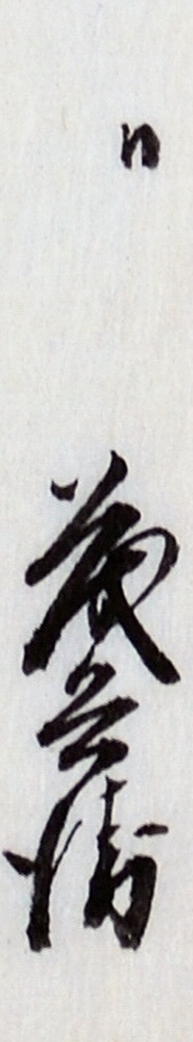同茂兵衛
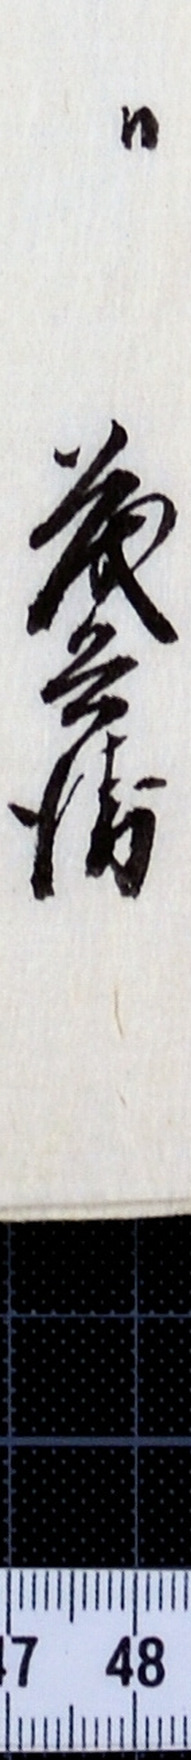同茂兵衛
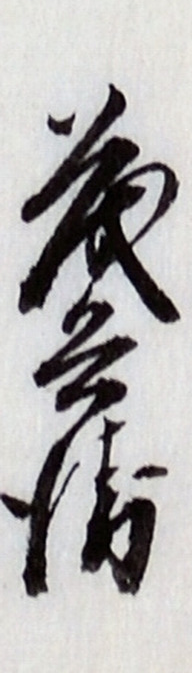同茂兵衛
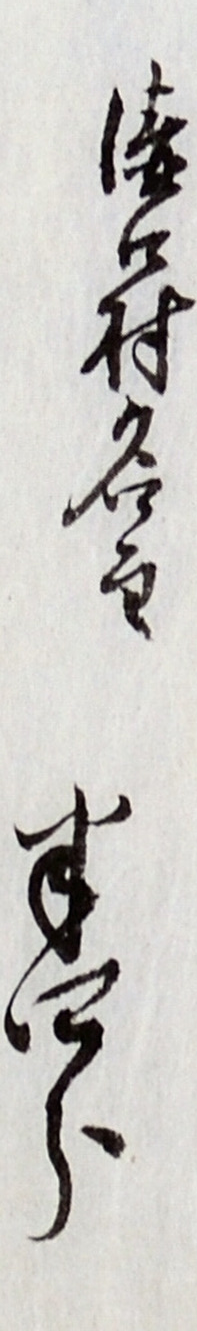漆口村名主半四郎
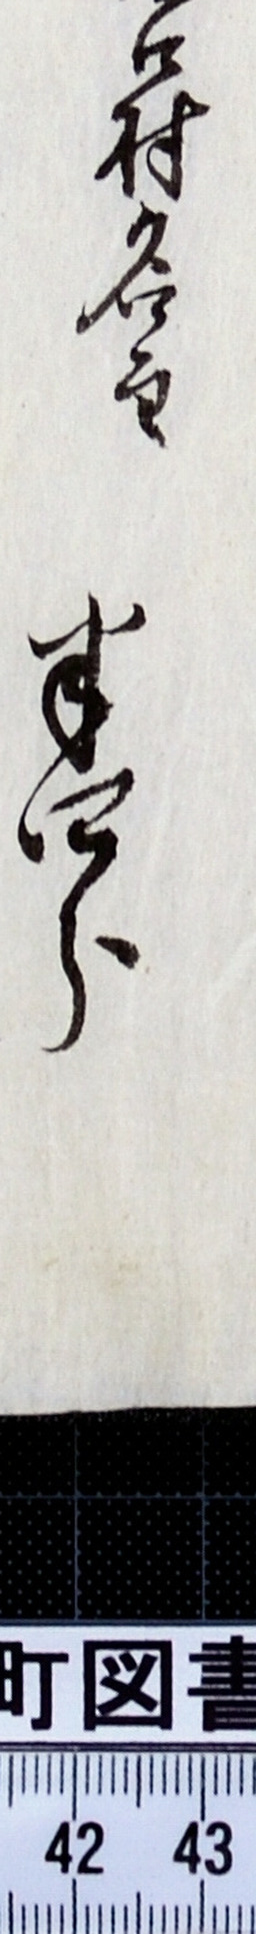漆口村名主半四郎
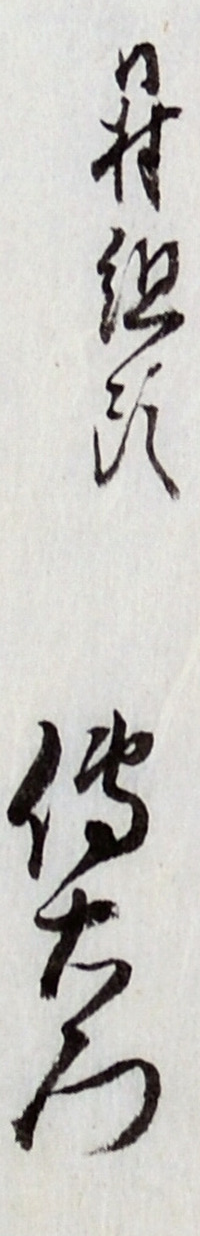同村組頭伝右衛門
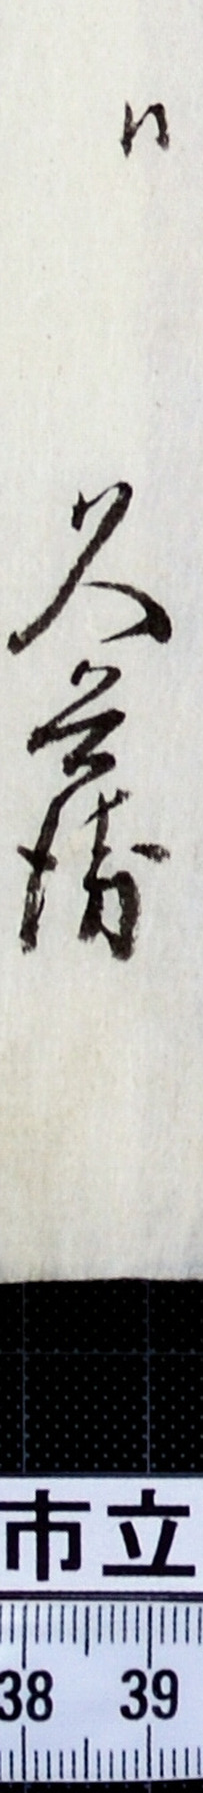同久兵衛
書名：御林御竹藪証文控
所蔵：伊那市立高遠町図書館・合同会社AMANE
